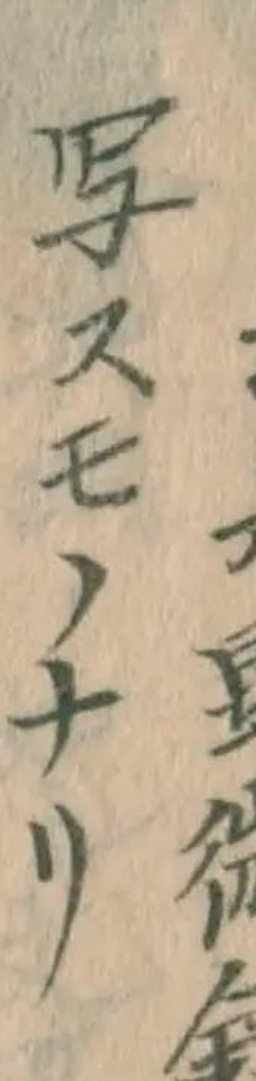写スモノナリ

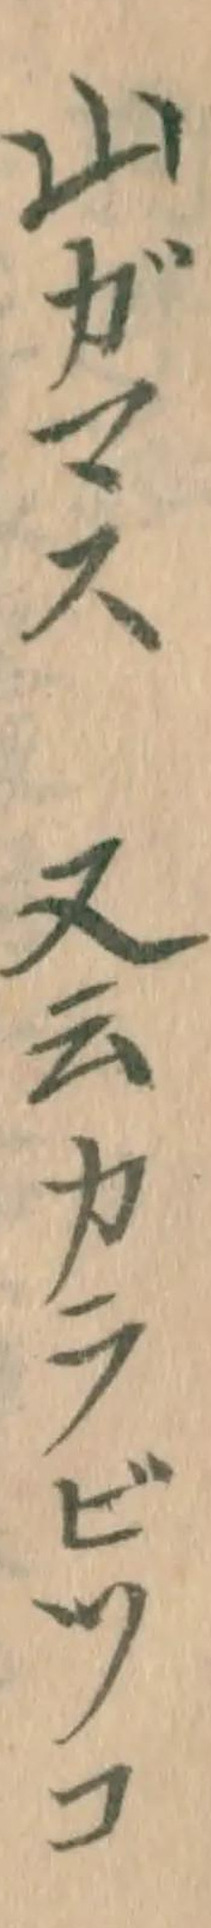山ガマス又云カラビツコ
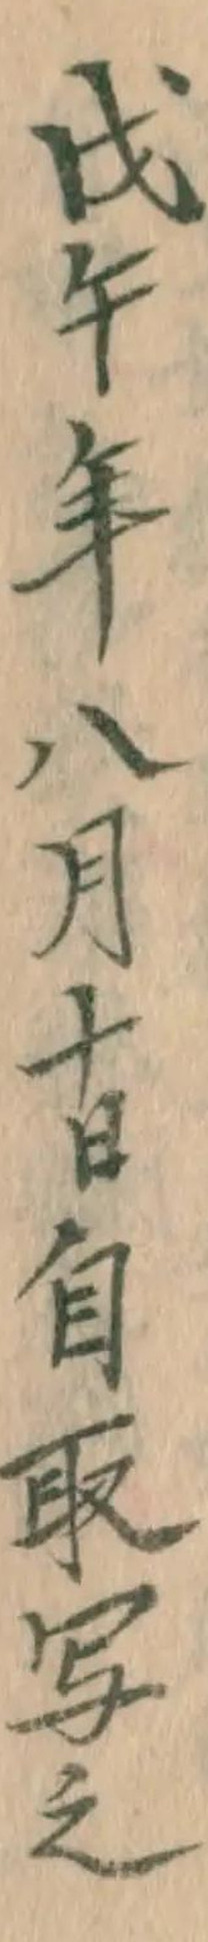戊午年八月十日自取写之
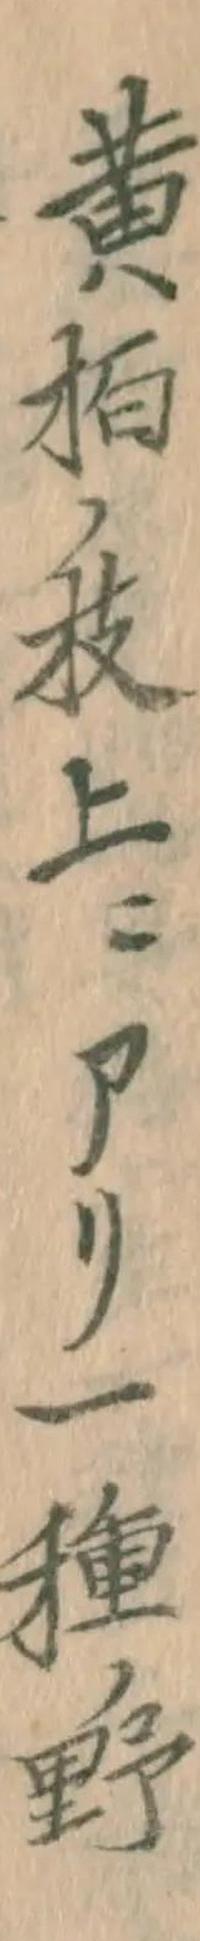黄栢ノ枝上ニアリ一種ノ野
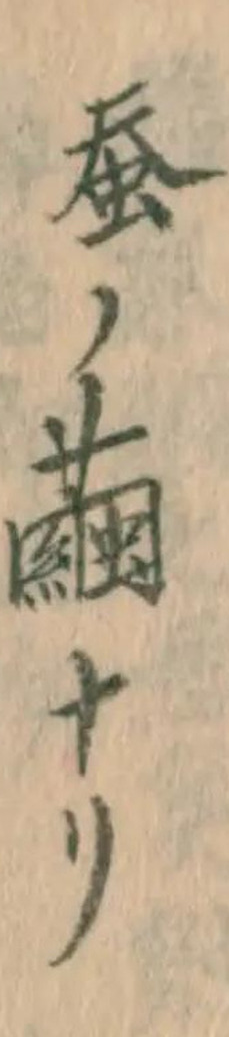蚕ノ繭ナリ
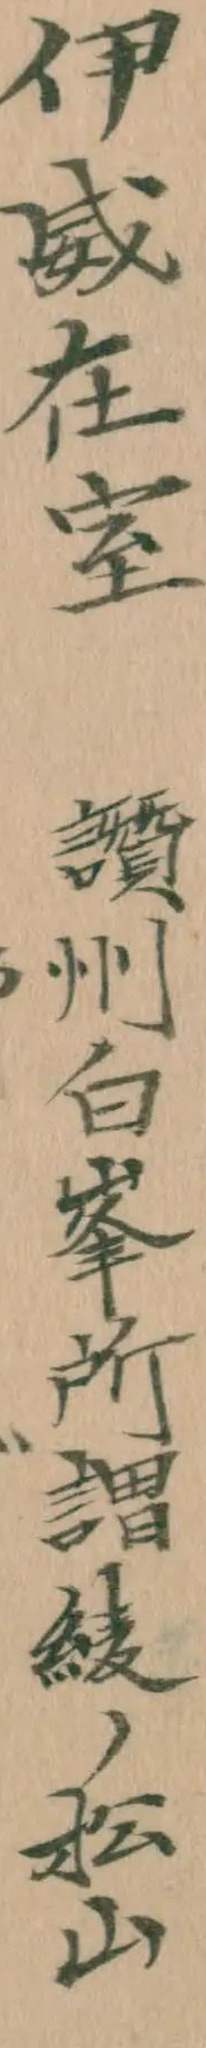伊威在室讃州白峯所謂綾ノ松山
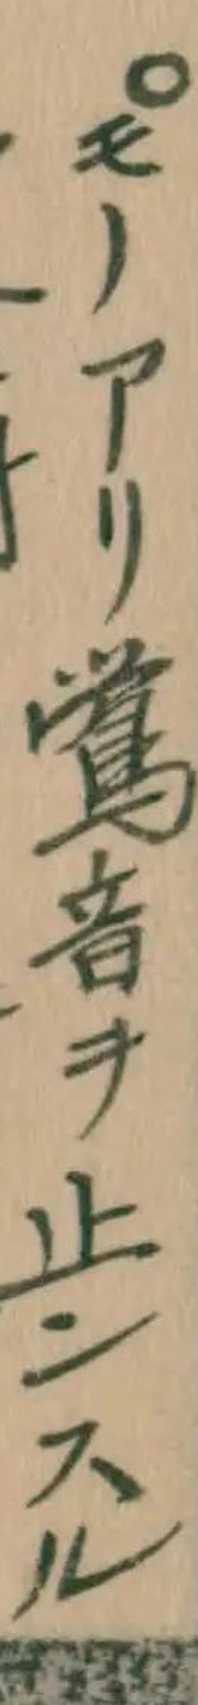○モノアリ鴬音ヲ止ンスル
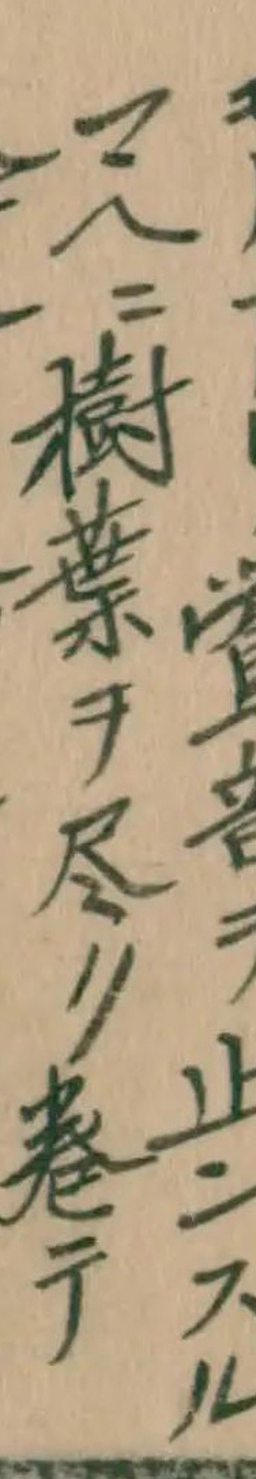マヘニ樹葉ヲ尽ク巻テ
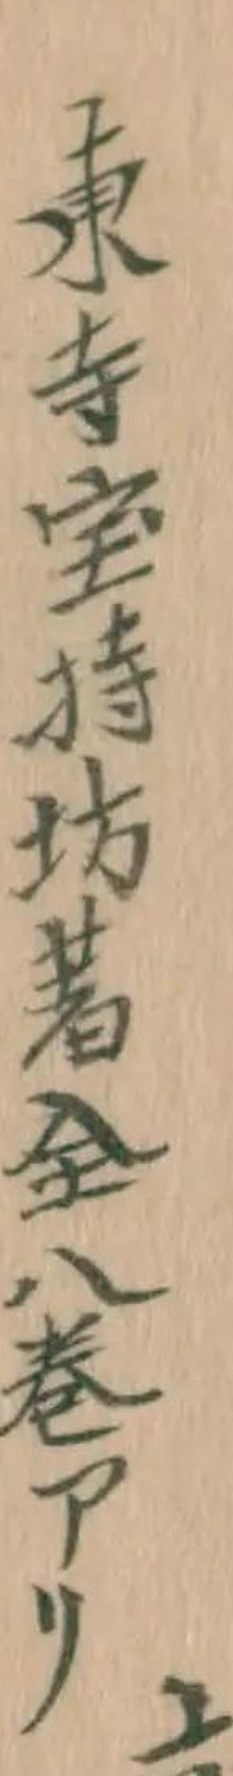東寺宝持坊著全八巻アアリ
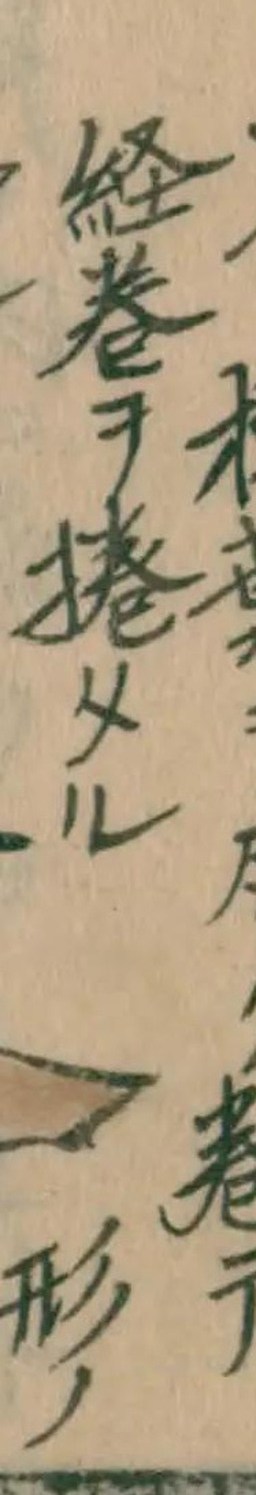経巻ヲ捲タル形ノ
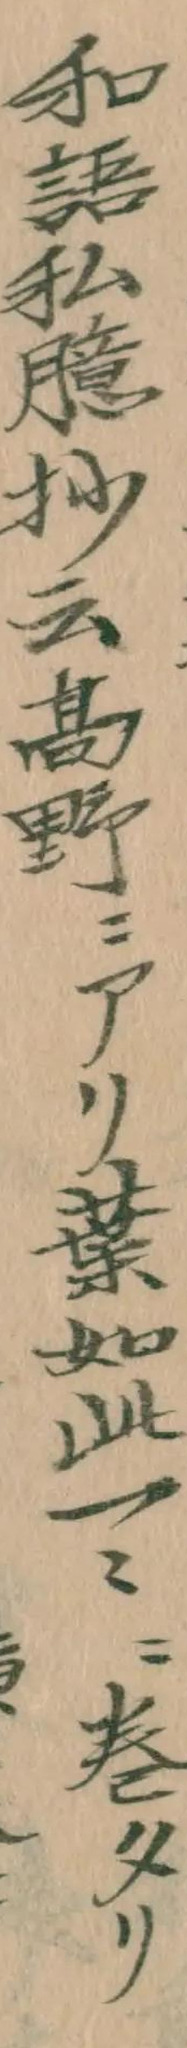和語私臆抄云髙野ニアリ葉如此一々ニ巻タリ
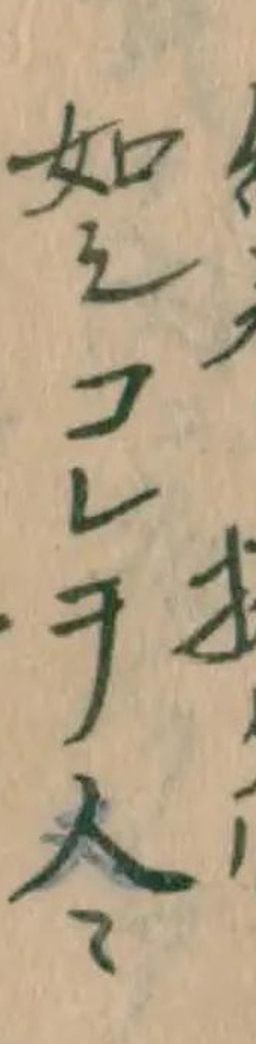如シコレヲ人々見レ
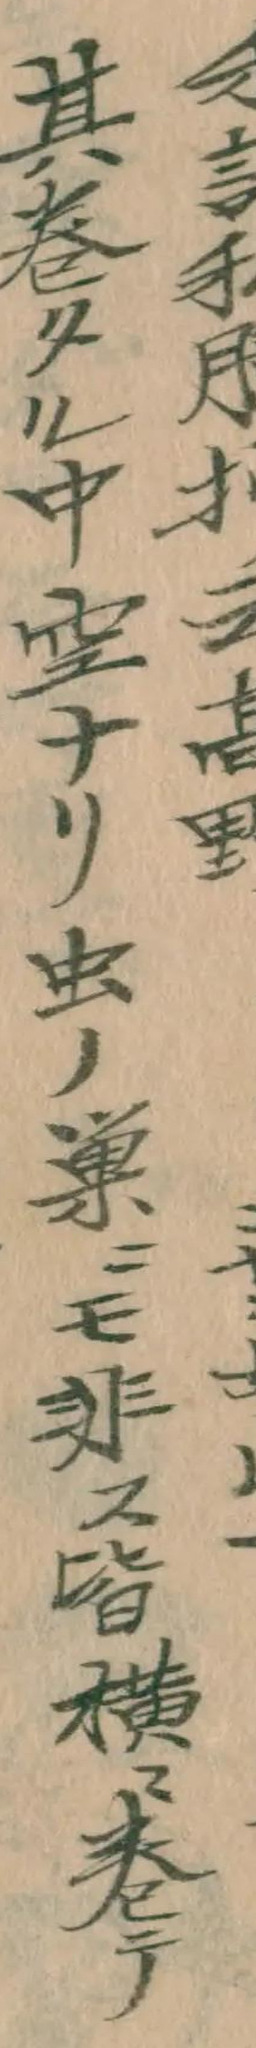其巻タル中空ナリ虫ノ巣ニモ非ス皆横ニ巻テ
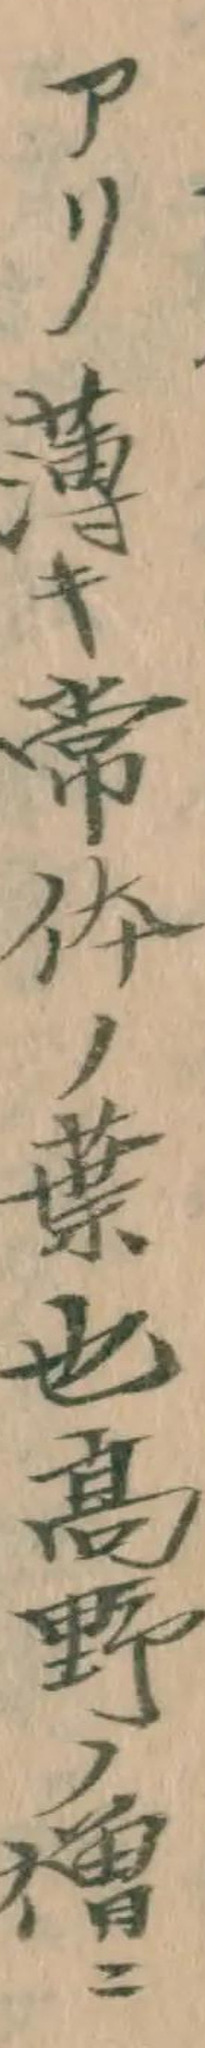アリ薄キ常体ノ葉也髙野ノ僧ニ
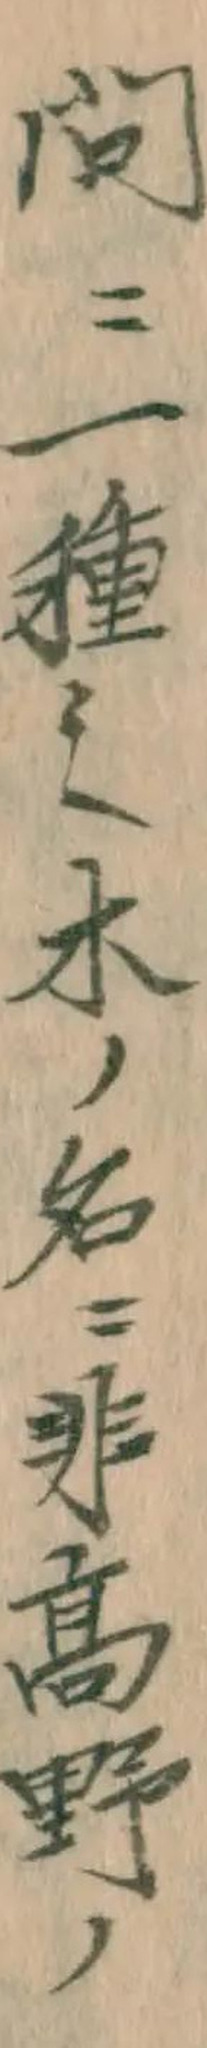問ニ一種之木ノ名ニ非髙野ノ
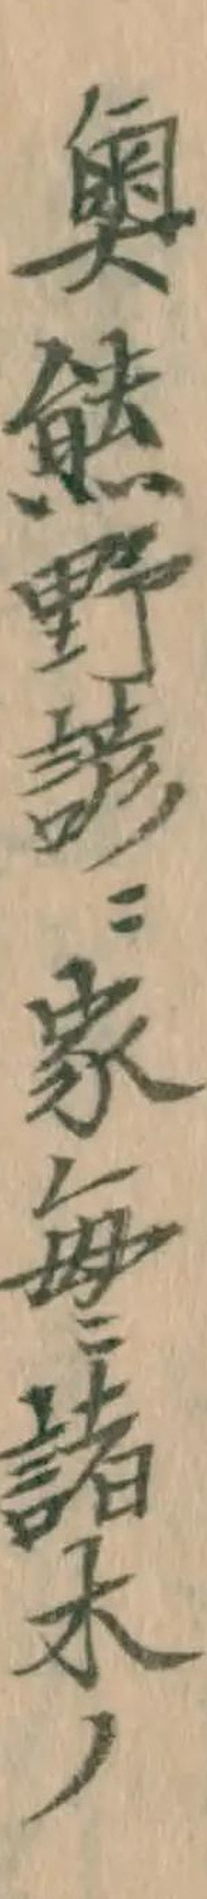奥熊野諺ニ家毎ニ諸木ノ
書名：千蟲譜 3巻. [1]
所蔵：国立国会図書館 National Diet Library, JAPAN
